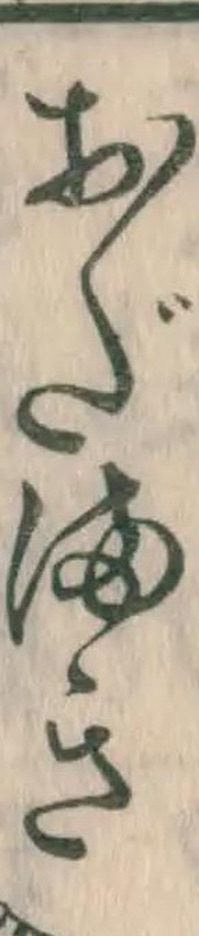おだまき
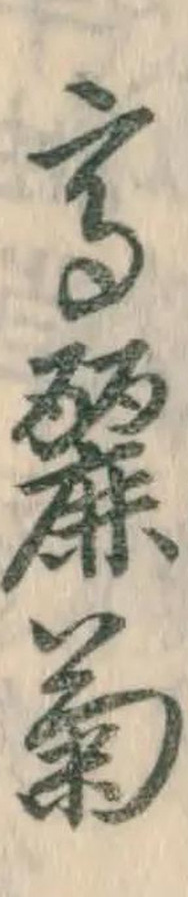高麗菊

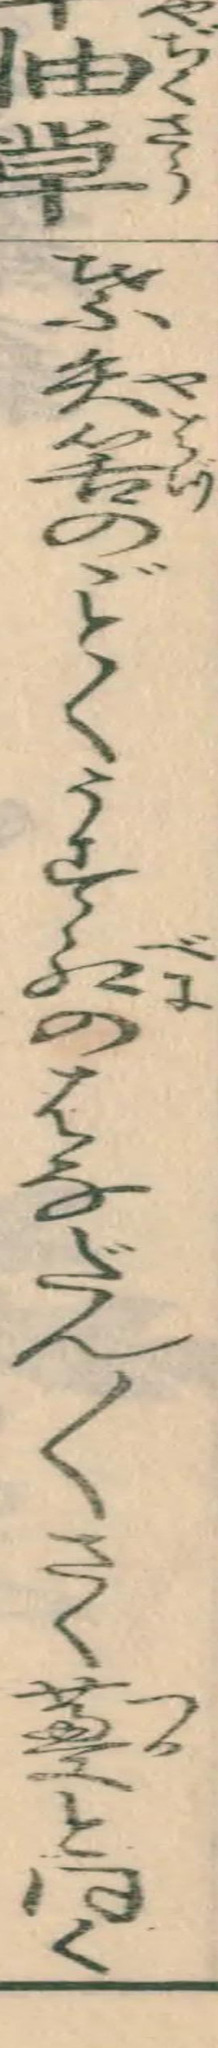葉矢筈のごとくうす紅のはなだん〳〵さく蔓と同く
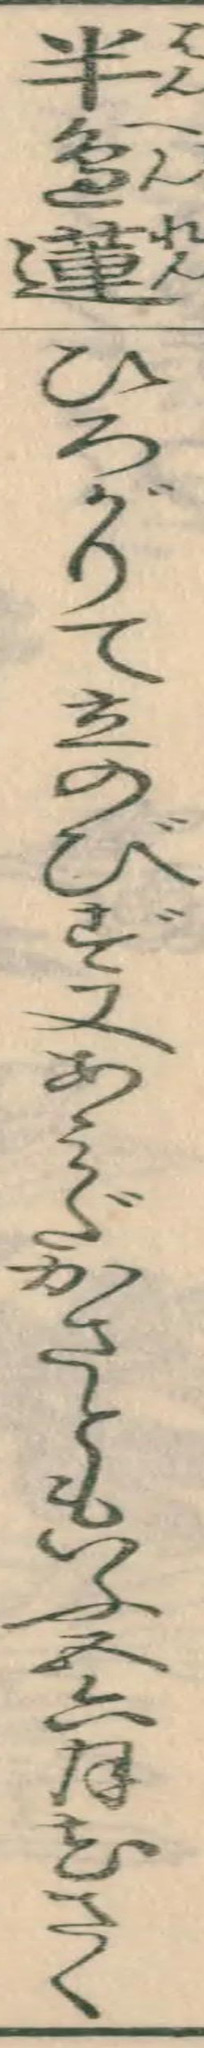ひろがりて立のびず又あみだかさともいふ五六月花さく
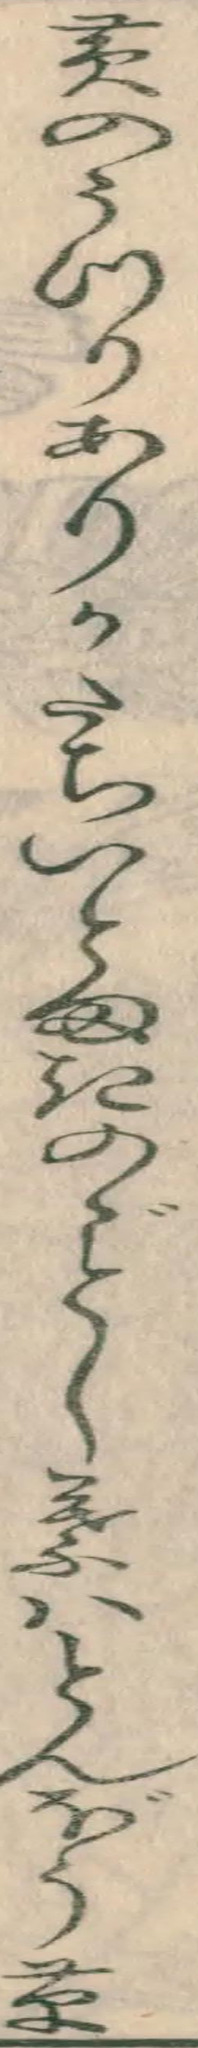黄のうつりありかたちいとまきのごとし葉はとんぼう草
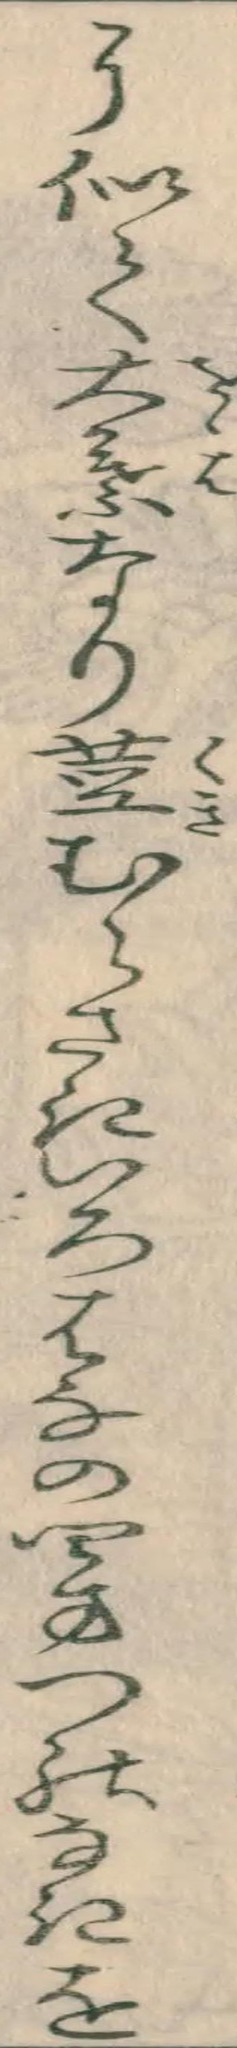に似て大葉なり茎むらさきいろはなの四方つのなきを
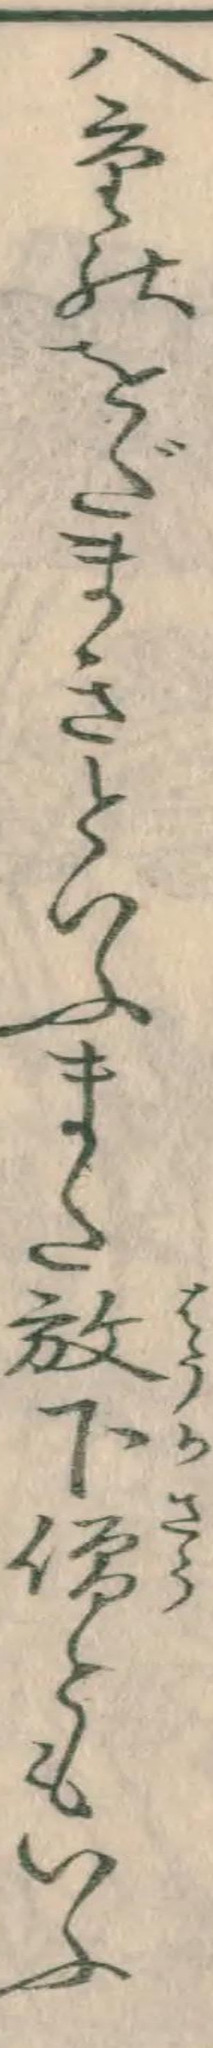八重のをだまきといふまた放下僧ともいふ
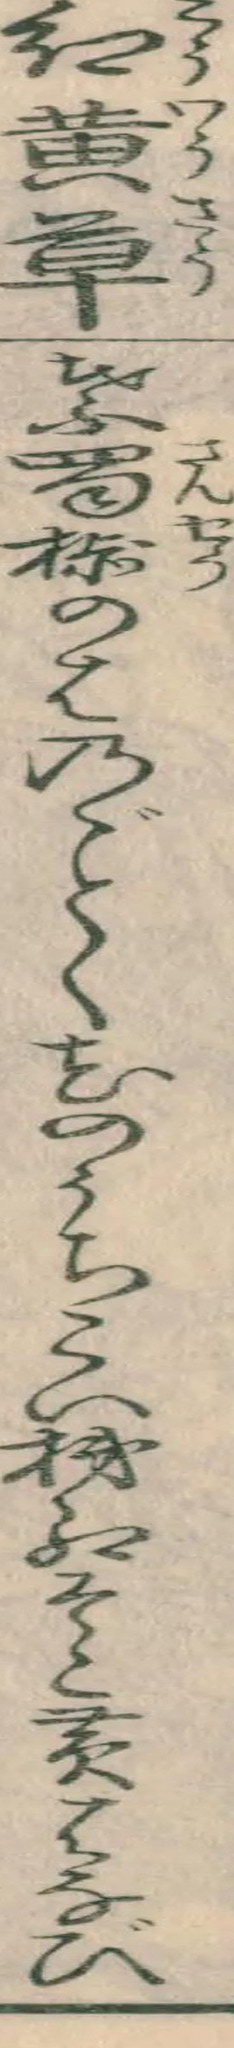葉蜀椒のはのごとく花のうちこい柿紅そと黄はなび
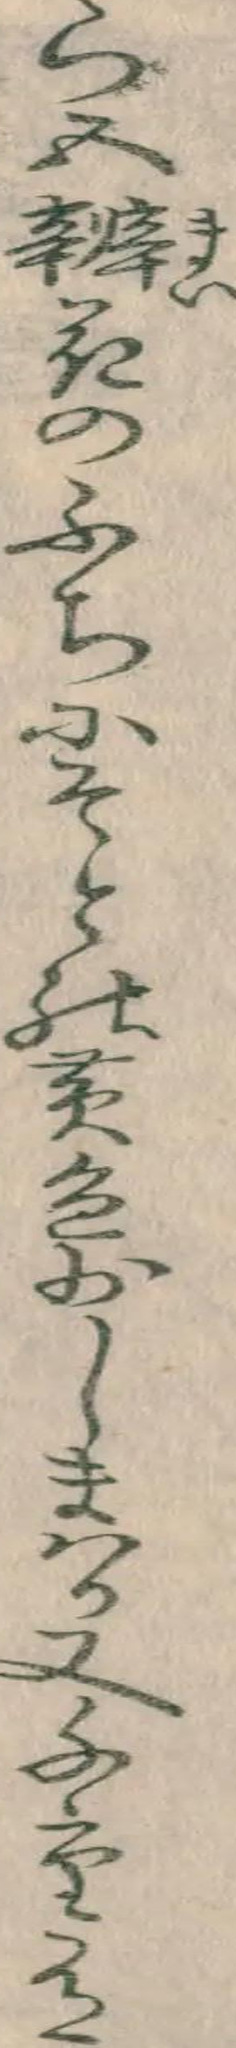ら五弁花のふちにそとの黄色少しまはり又千重有
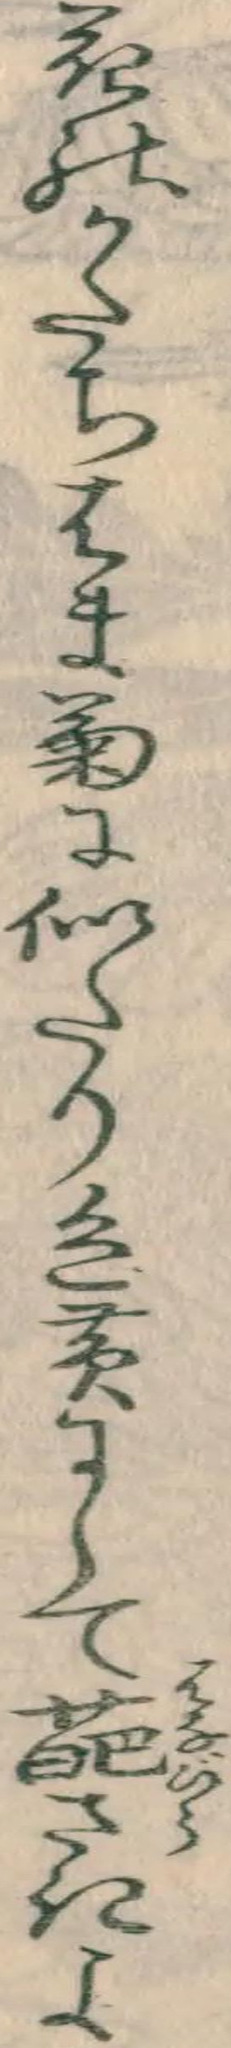花のかたちはま菊に似たり色黄にして葩さきよ
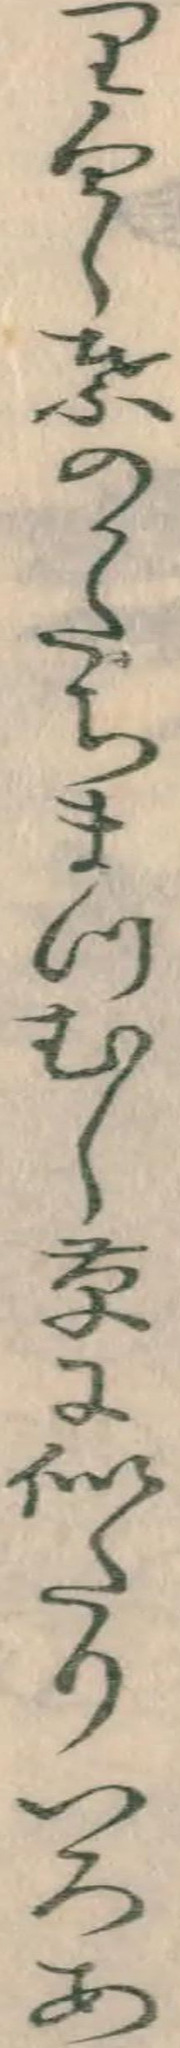り白し葉のかたちまつむし草に似たりいろあ
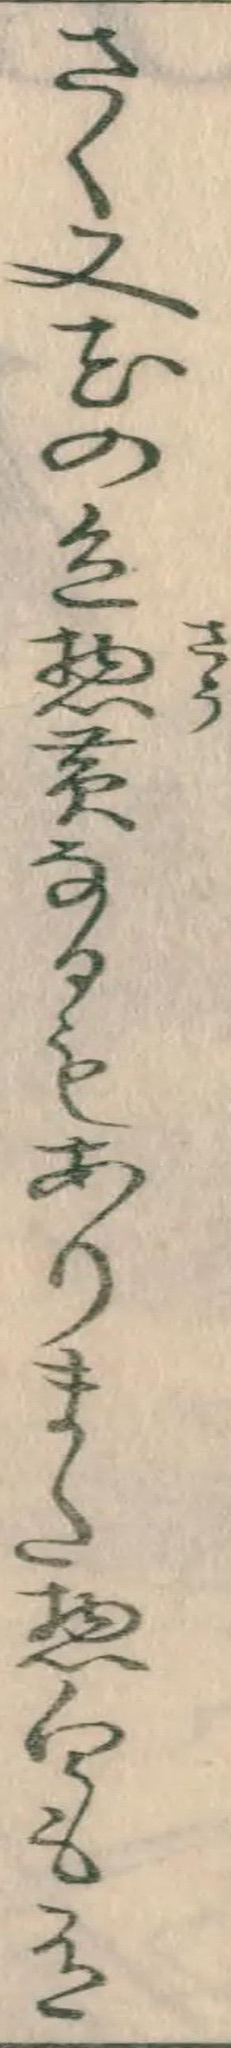さく又花の色総黄なるもありまた総白も有
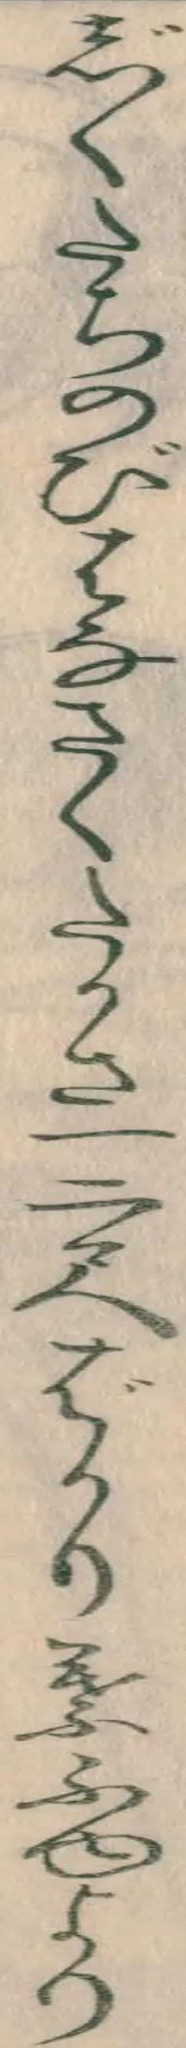じくたちのびはなさくたかさ一二尺ばかり葉ふゆより
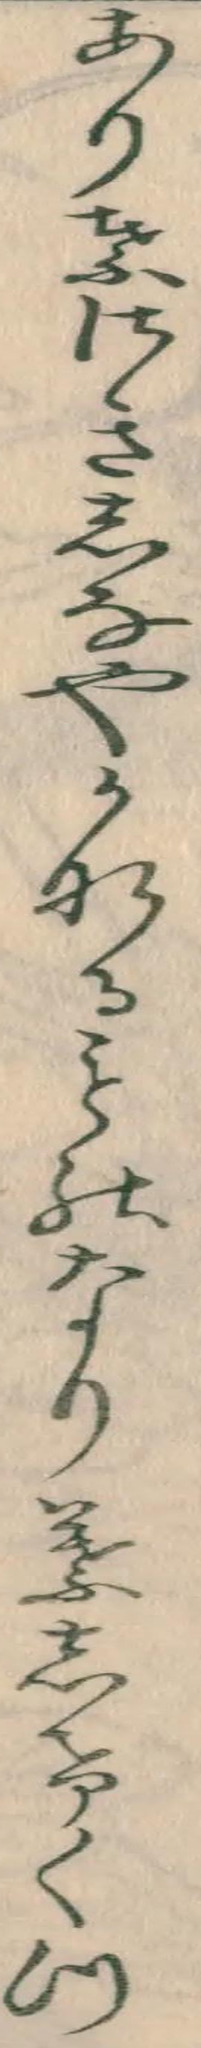あり葉さきしなやかなるものなり葉しけくつ
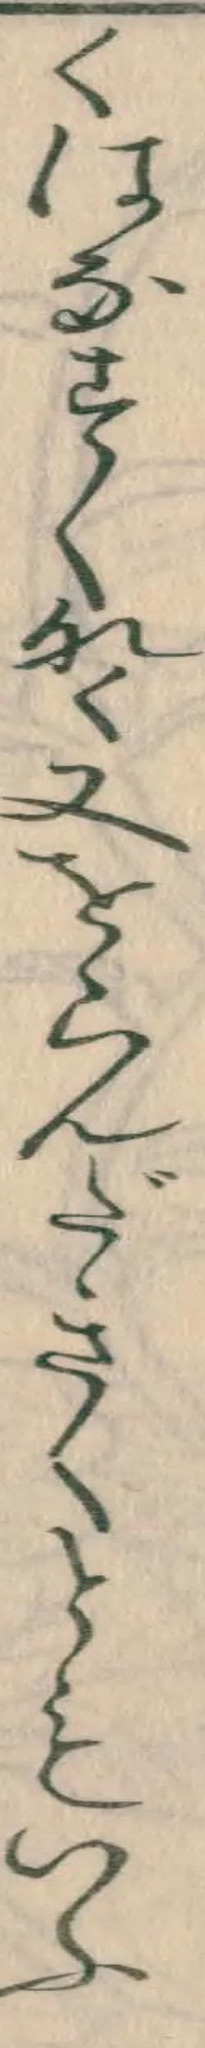くはなすくなく又をらんだきくともいふ
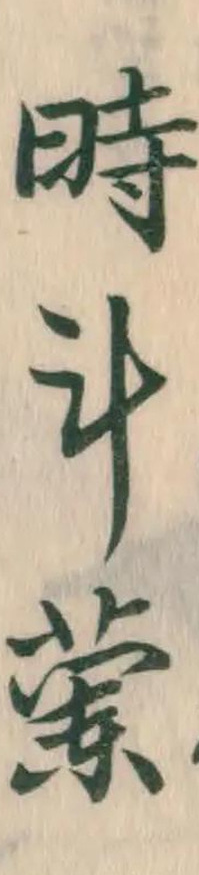時計蘭
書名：畫本野山草. [1]
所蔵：国立国会図書館 National Diet Library, JAPAN
